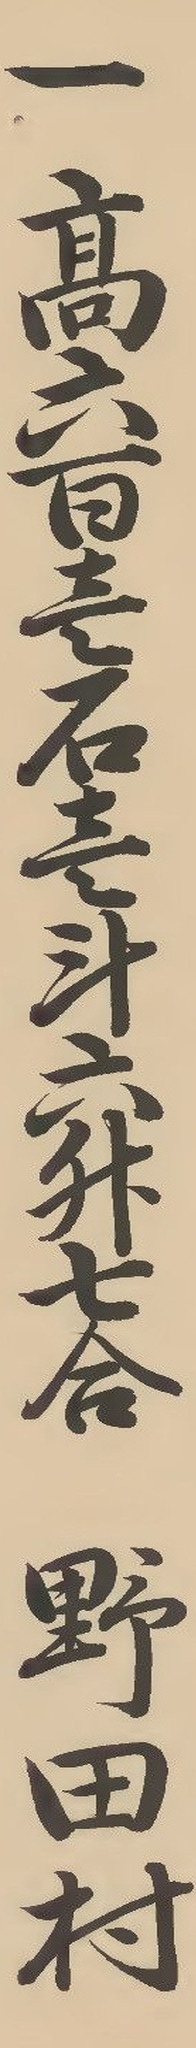一高六百壱石壱斗六升七合野田村
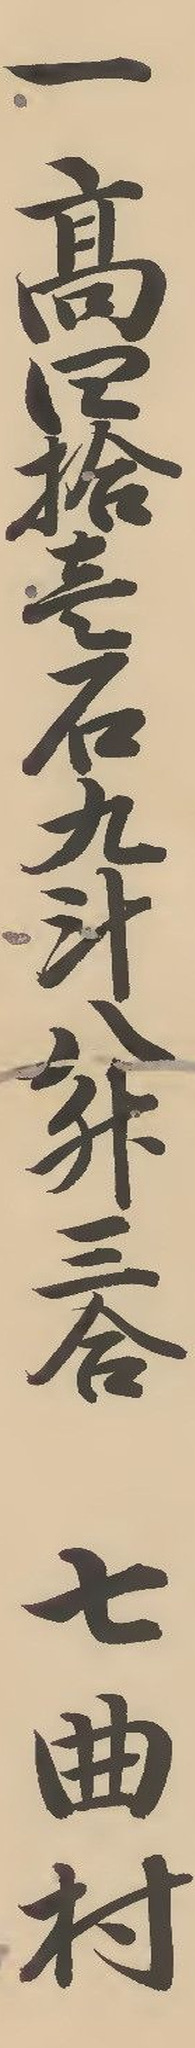一高四拾壱石九斗八升三合七曲村

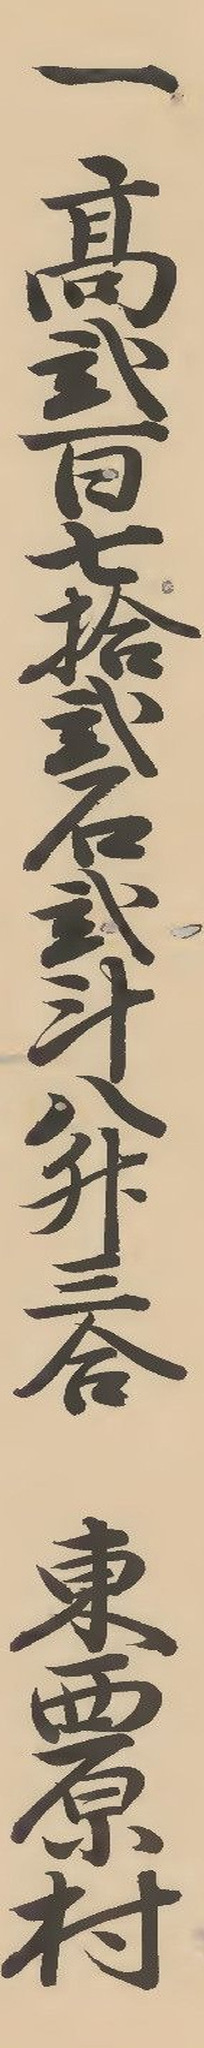一高弐百七拾弐石弐斗八升三合東西原村
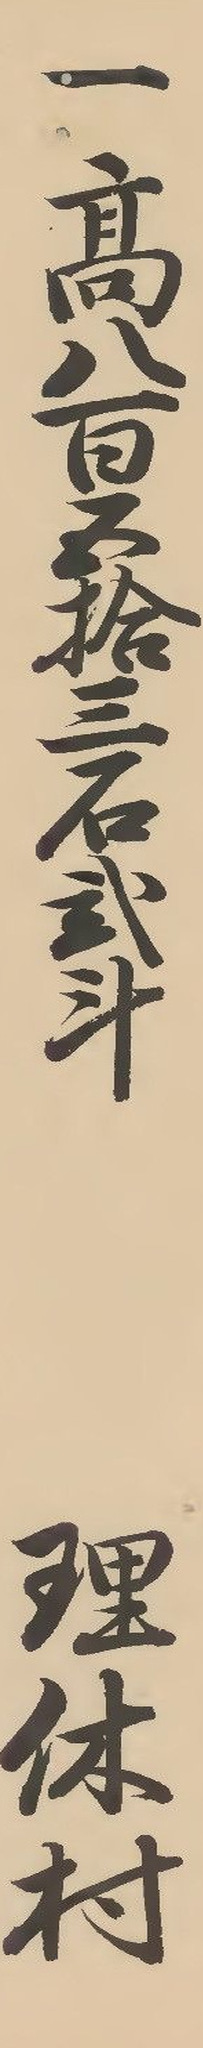一高八百五拾三石弐斗理休村
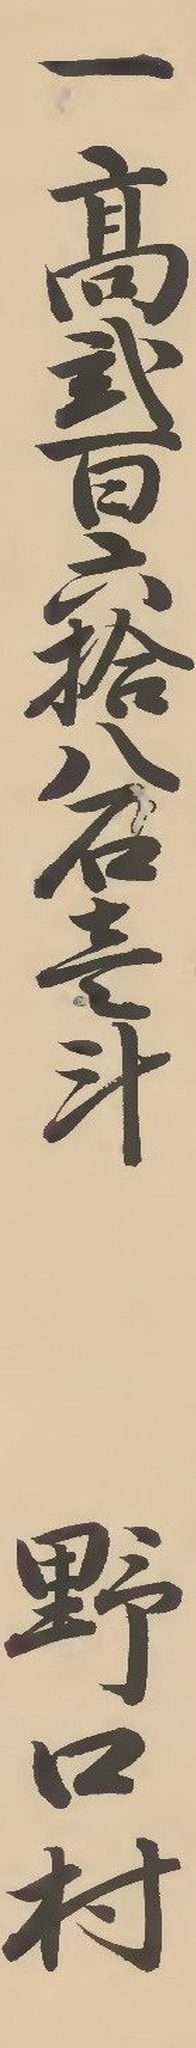一高弐百六拾八石壱斗野口村
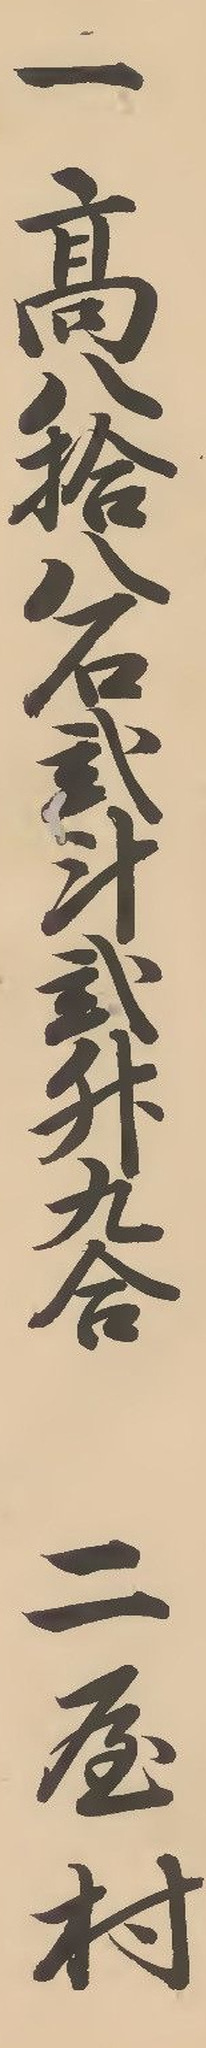一高八拾八石弐斗弐升九合二屋村
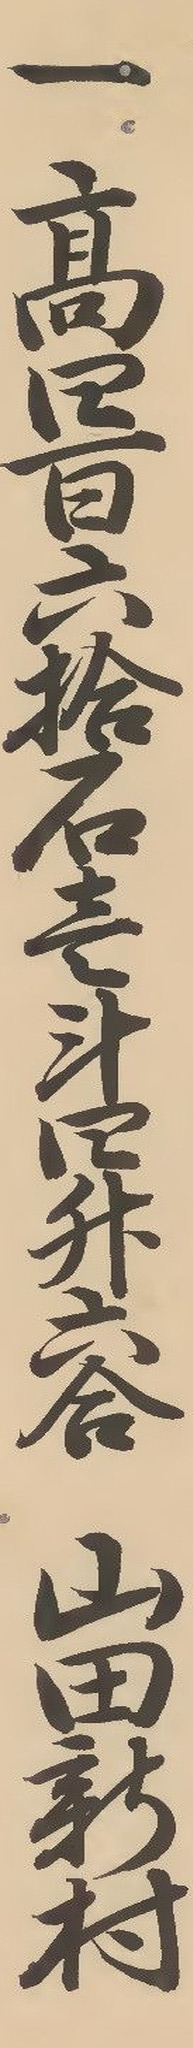一高四百六拾石壱斗四升六合山田新村
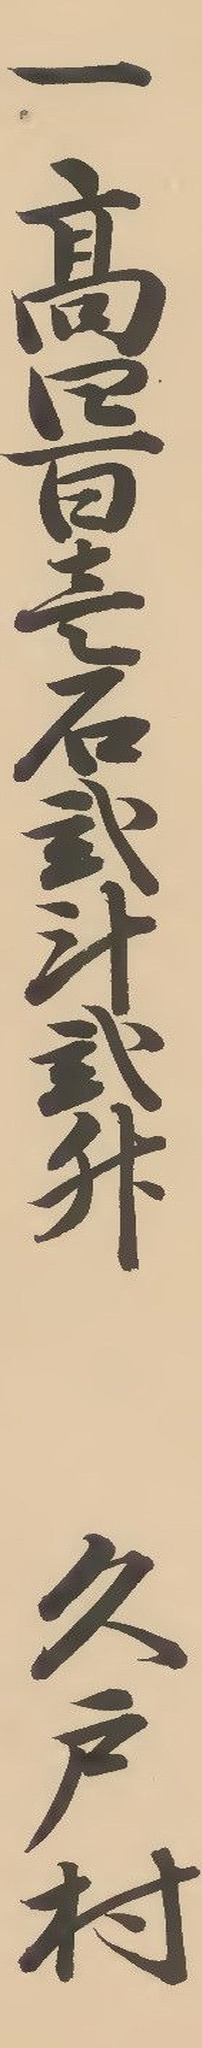一高四百壱石弐斗弐升久戸村
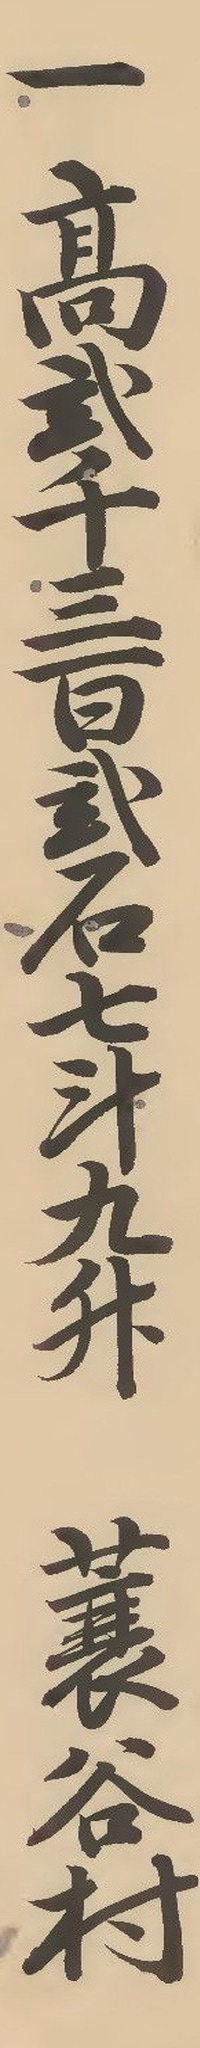一高弐千三百弐石七斗九升蓑谷村

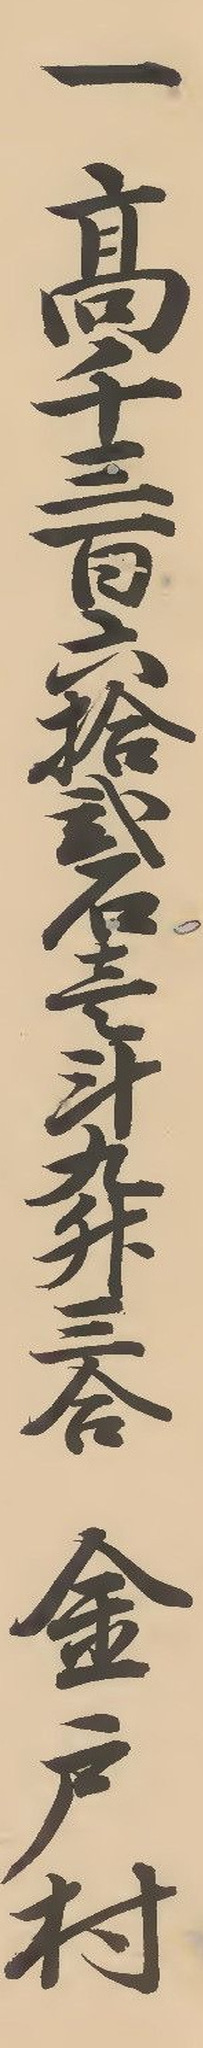一高千三百六拾弐石壱斗九升三合金戸村
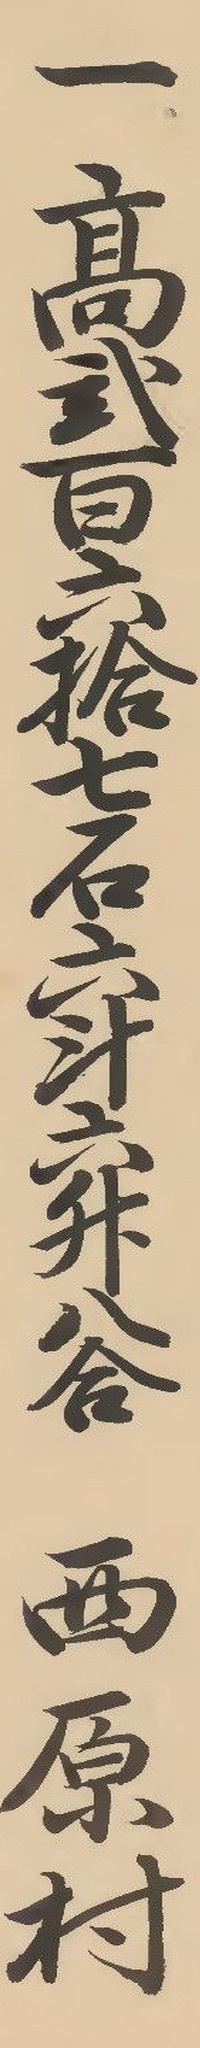一高弐百六拾七石六斗六升八合西原村
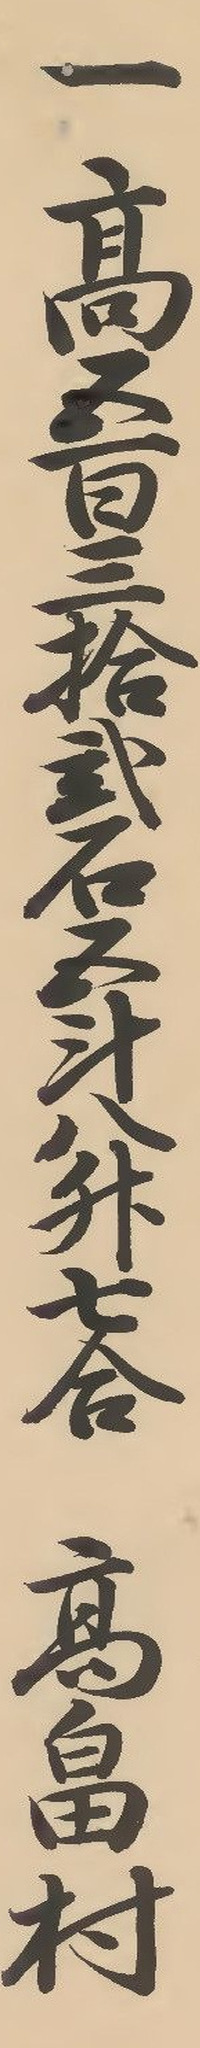一高五百三拾弐石五斗八升七合高畠村
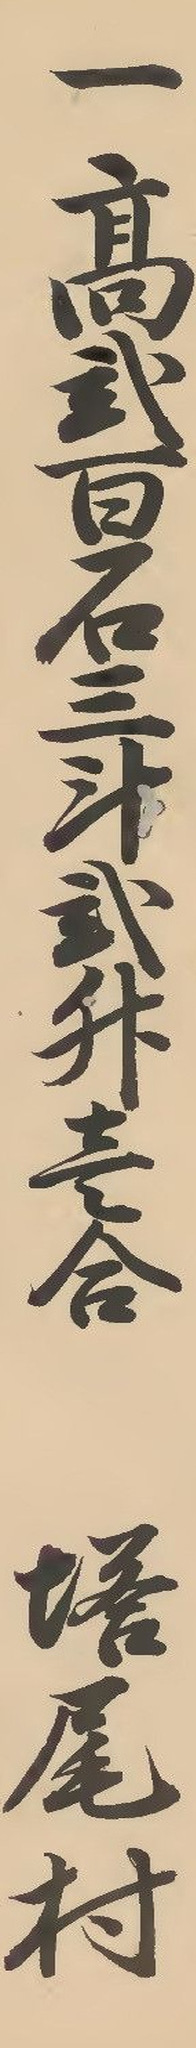一高弐百石三斗弐升壱合塔尾村
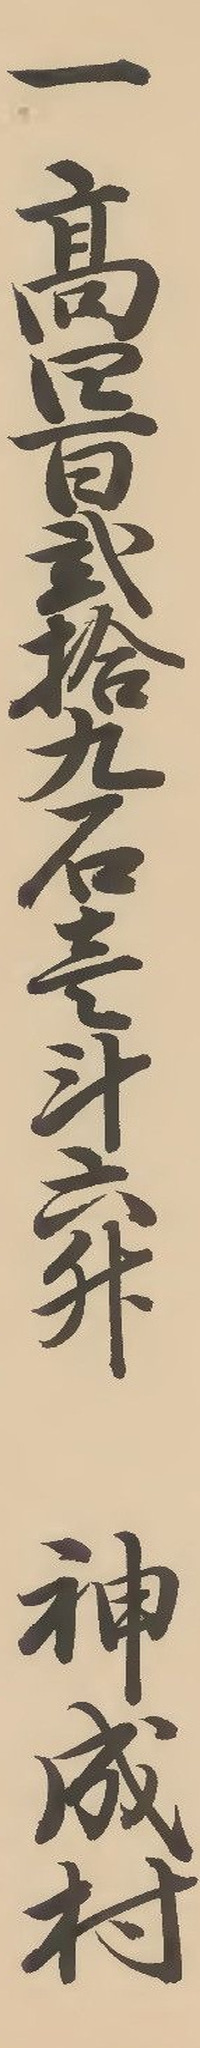一高四百弐拾九石壱斗六升神成村
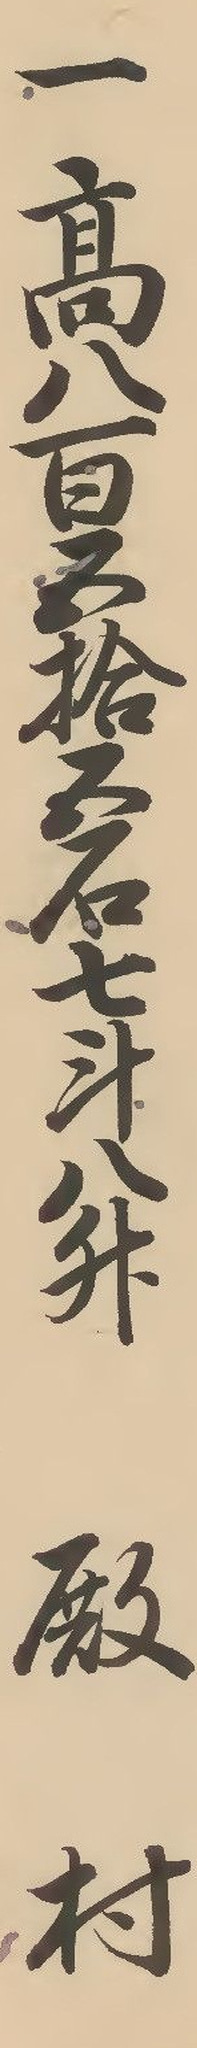一高八百五拾五石七斗八升殿村

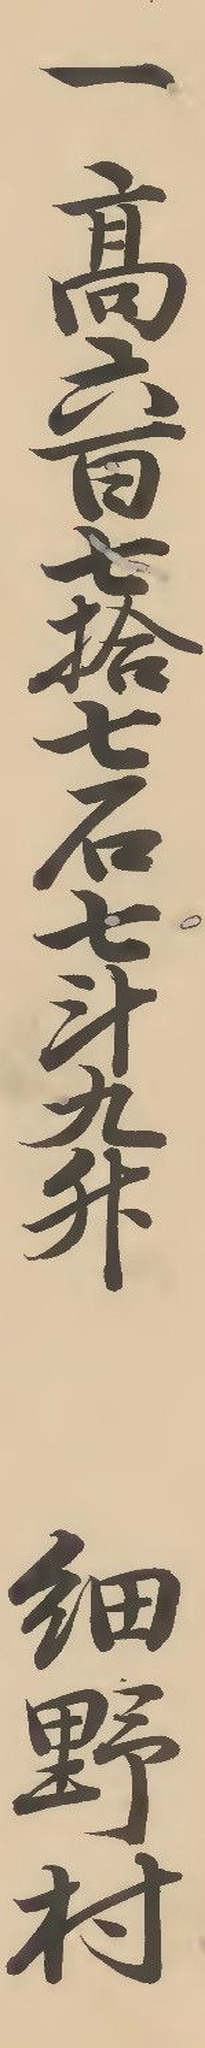一高六百七拾七石七斗九升細野村
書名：越中国郷帳
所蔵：国立公文書館 National Archives of Japan
